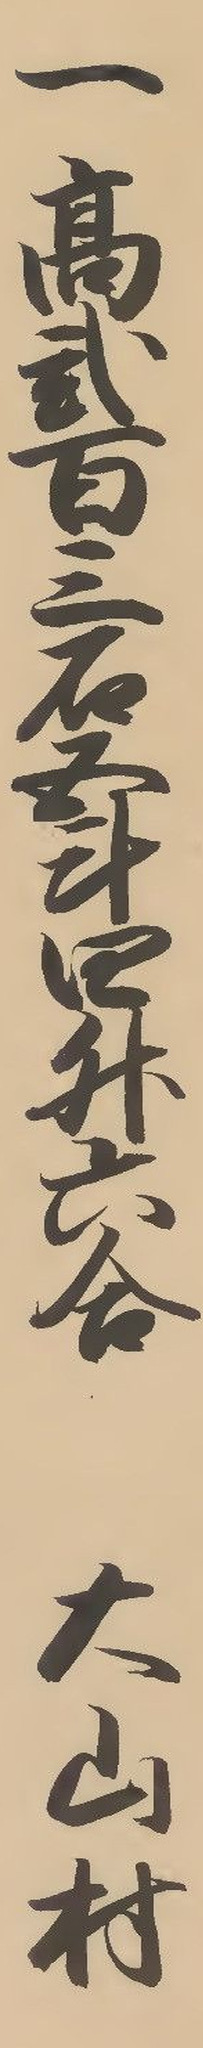一高弐百三石五斗四升六合大山村
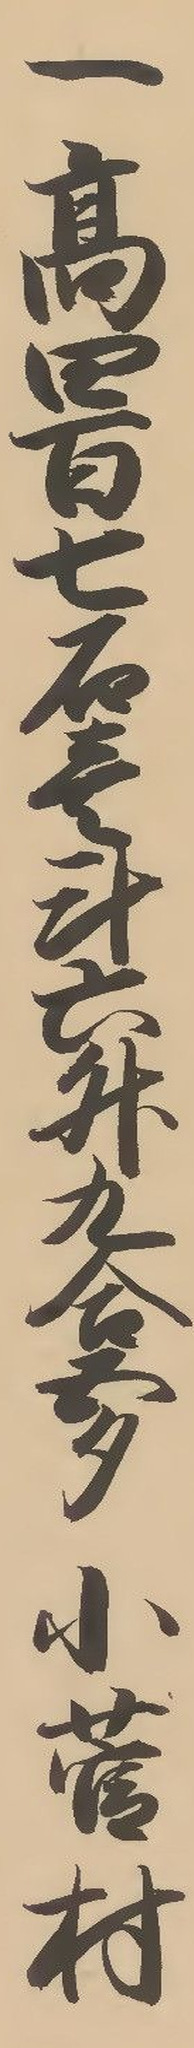一高四百七石壱斗六升九合五勺小菅村
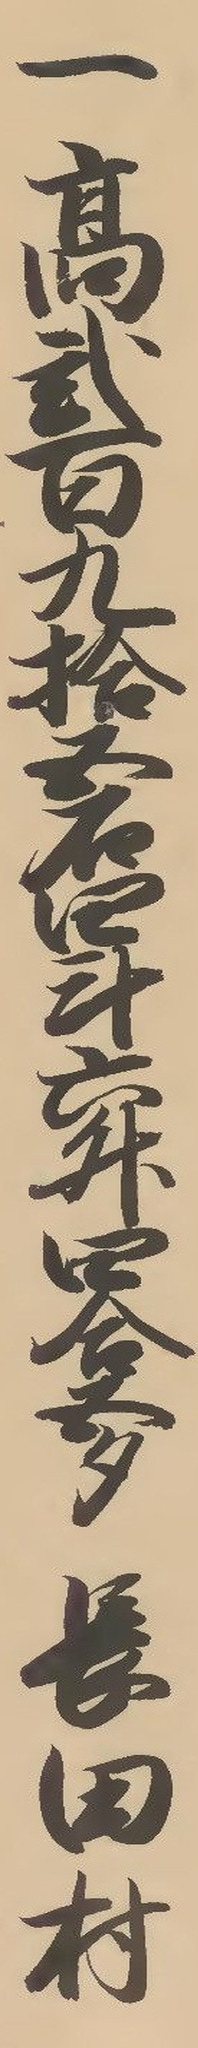一高弐百九拾五石四斗六升四合五勺長田村
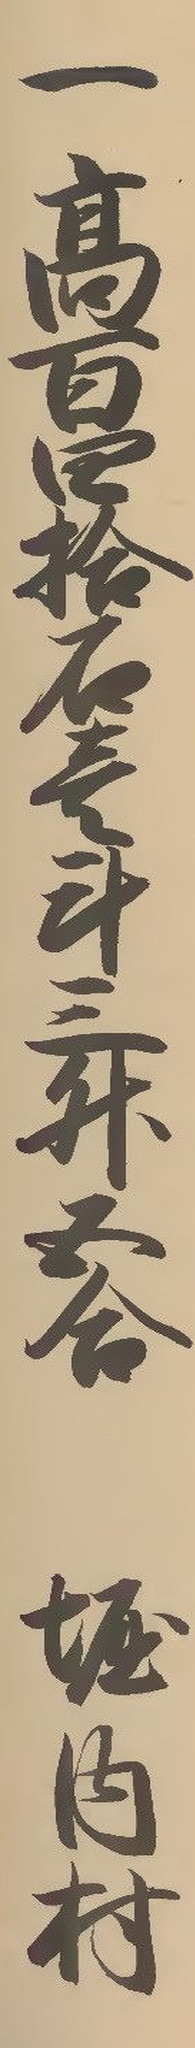一高百四拾石壱斗三升五合堀内村
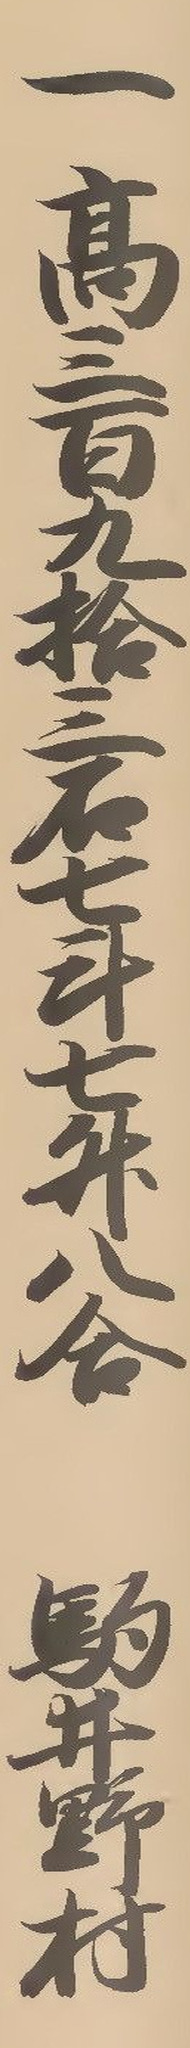一高三百九拾三石七斗七升八合駒井野村
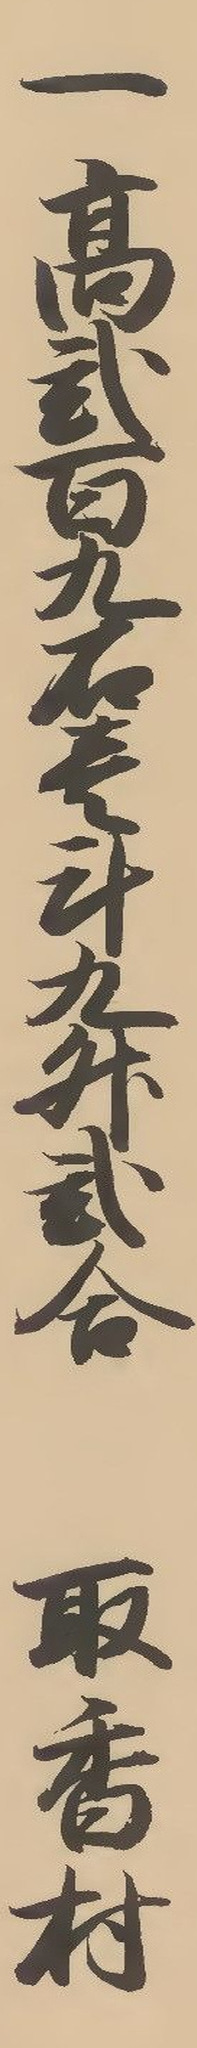一高弐百九石壱斗九升弐合取香村
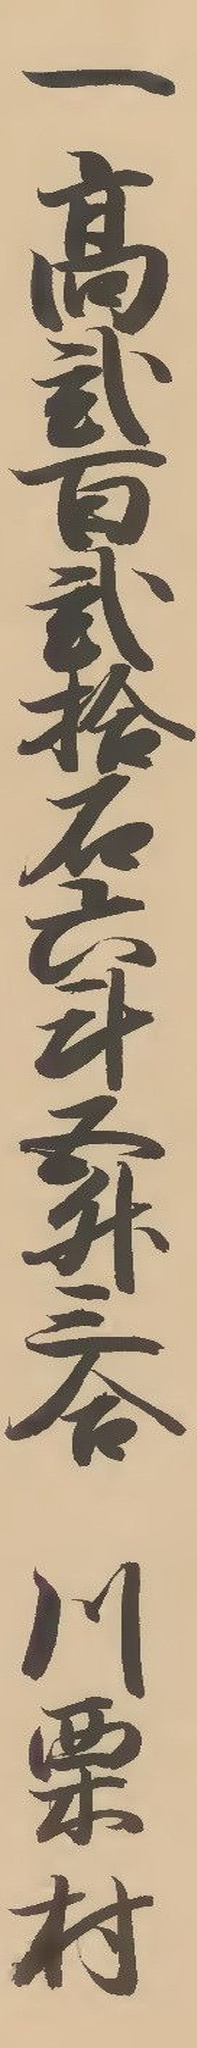一高弐百弐拾石六斗五升三合川栗村
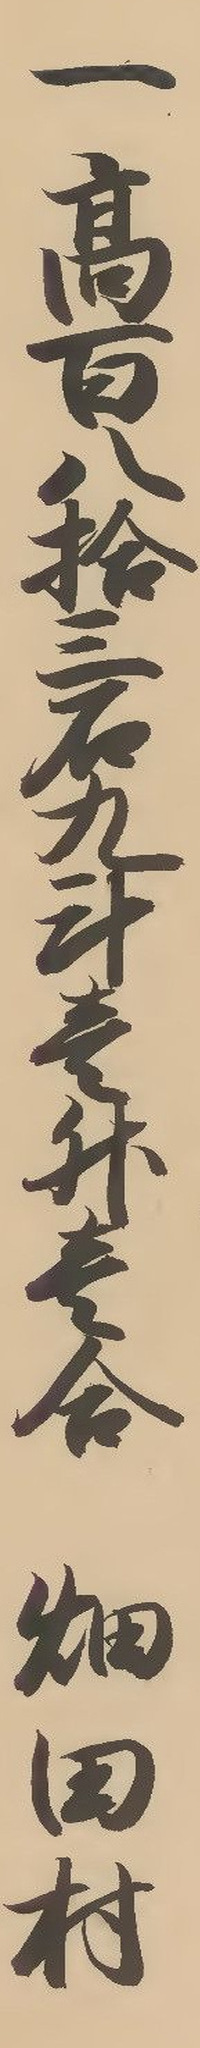一高百八拾三石九斗壱升壱合畑田村

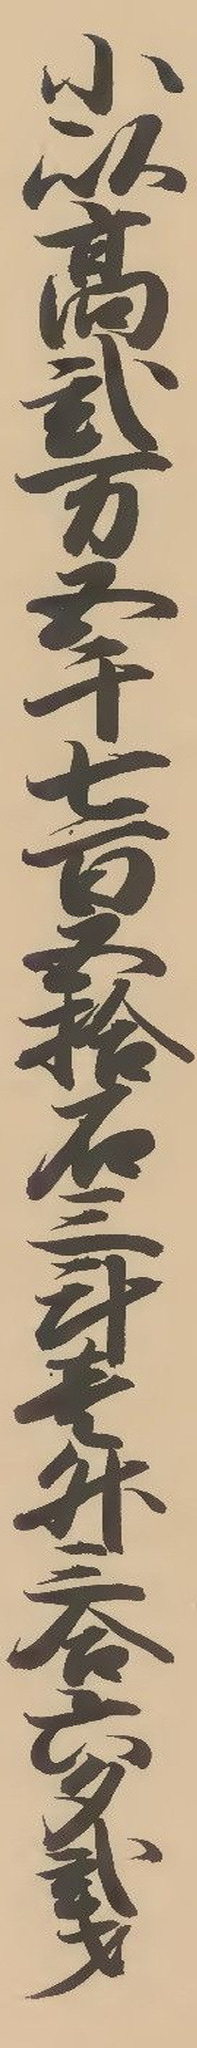小以高弐万五千七百五拾石三斗壱升三合六勺弐才
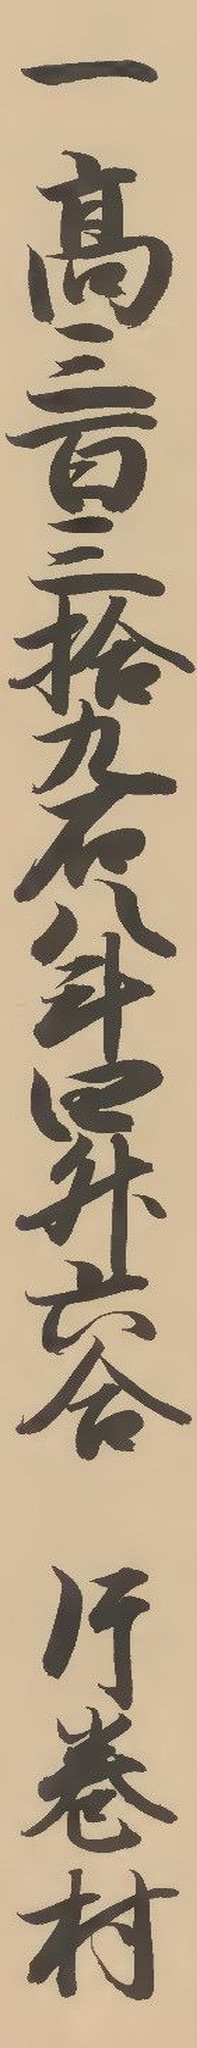一高三百三拾九石八斗四升六合片巻村
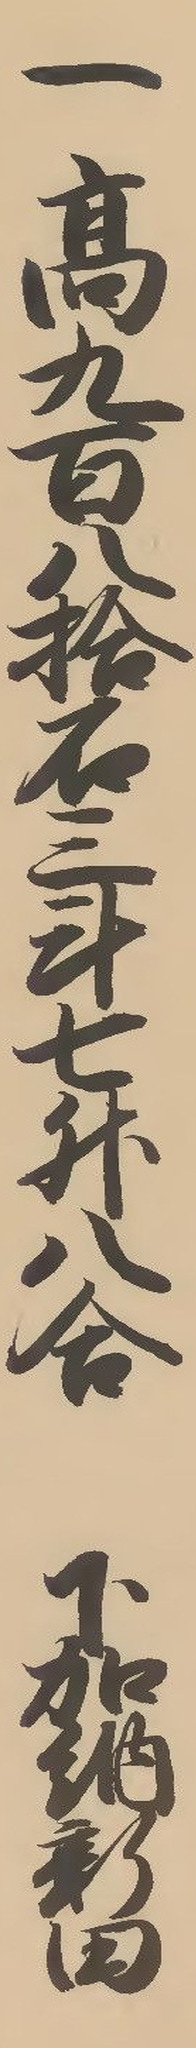一高九百八拾石三斗七升八合下加納新田
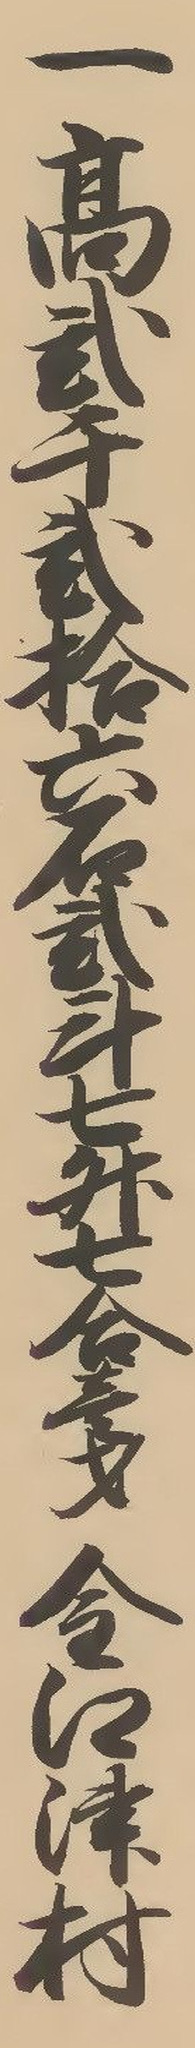一高弐千弐拾六石弐斗七升七合壱才金江津村

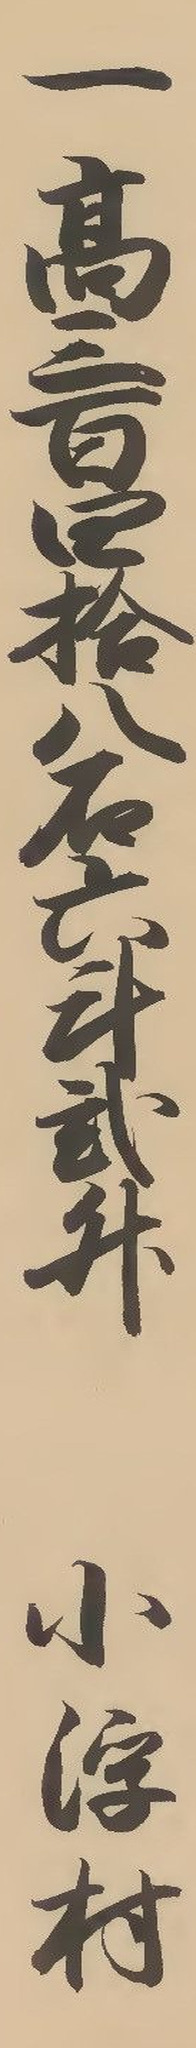一高三百四拾八石六斗弐升小浮村
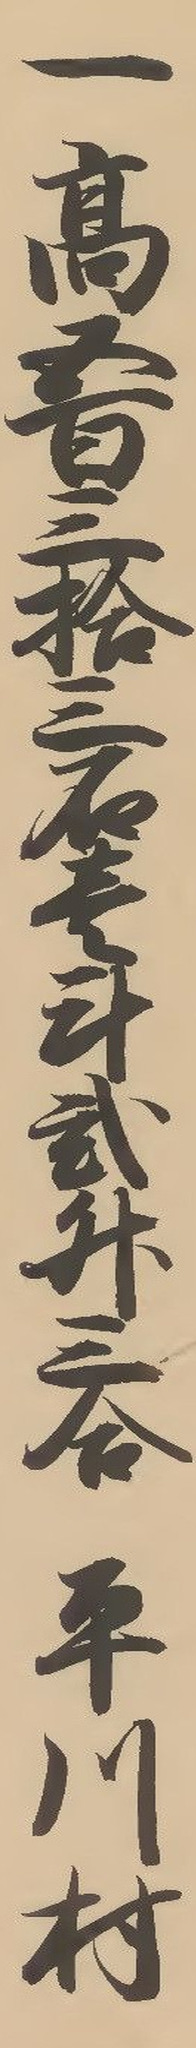一高五百三拾三石壱斗弐升三合平川村
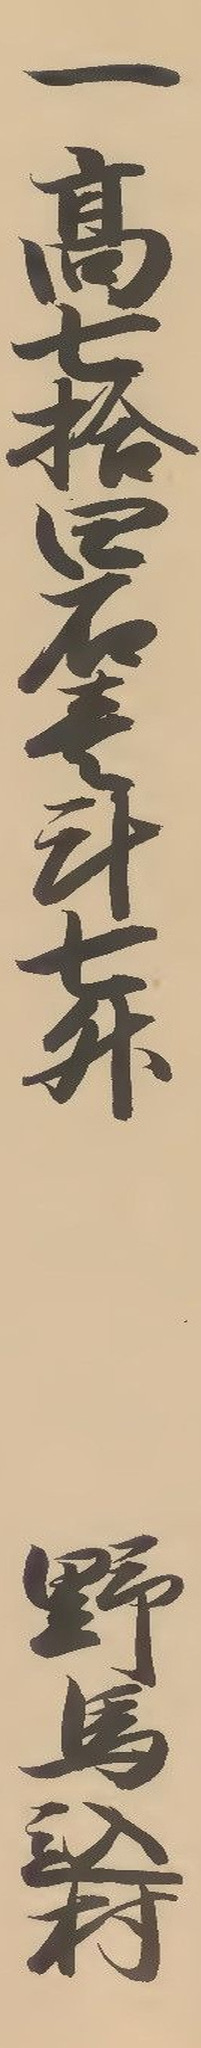一高七拾四石壱斗七升野馬込村
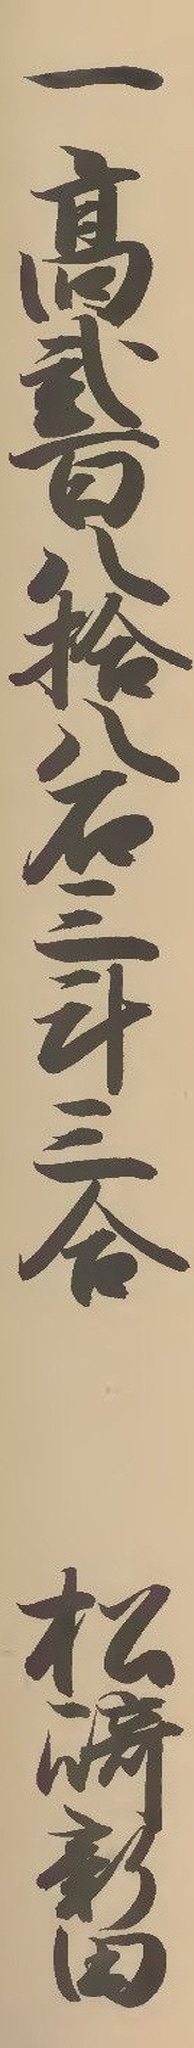一高弐百八拾八石三斗三合松崎新田
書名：下総国郷帳
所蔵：国立公文書館 National Archives of Japan
